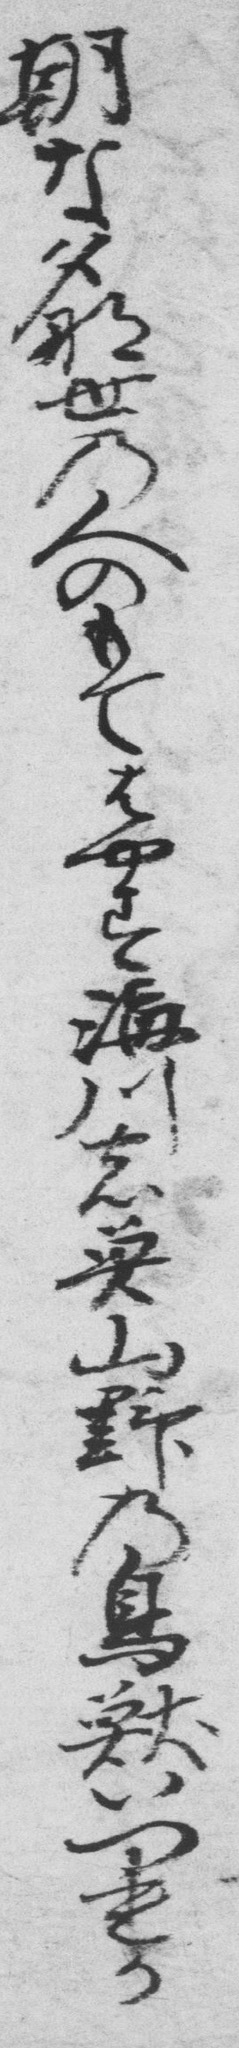朝な夕な世の人のもてはやす海川の魚山野の鳥獣いつれか
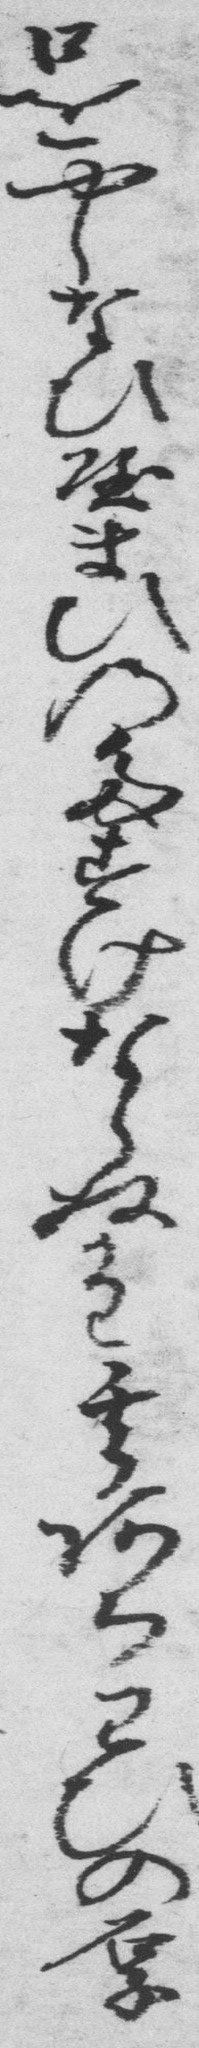口をやしなひやまひのたすけならぬかわ其あちわひの厚
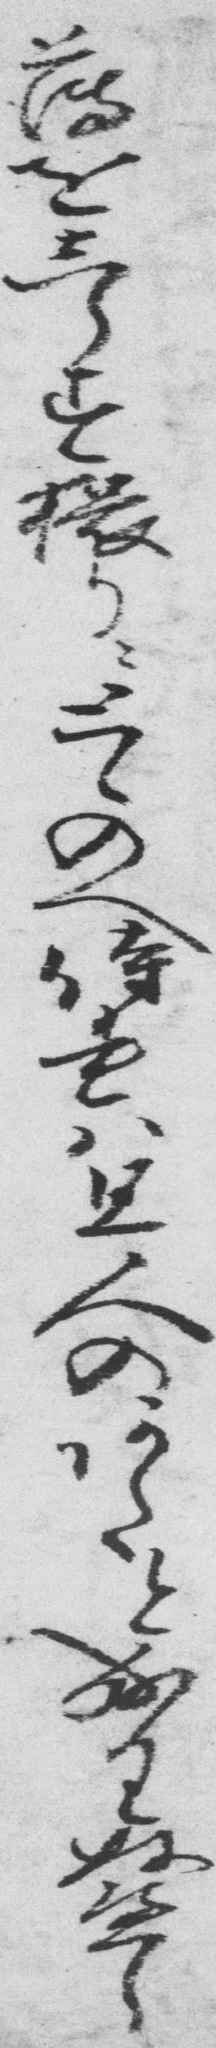薄をしらす猥りにとゝのへ侍れは只？人のあたと成りぬへし
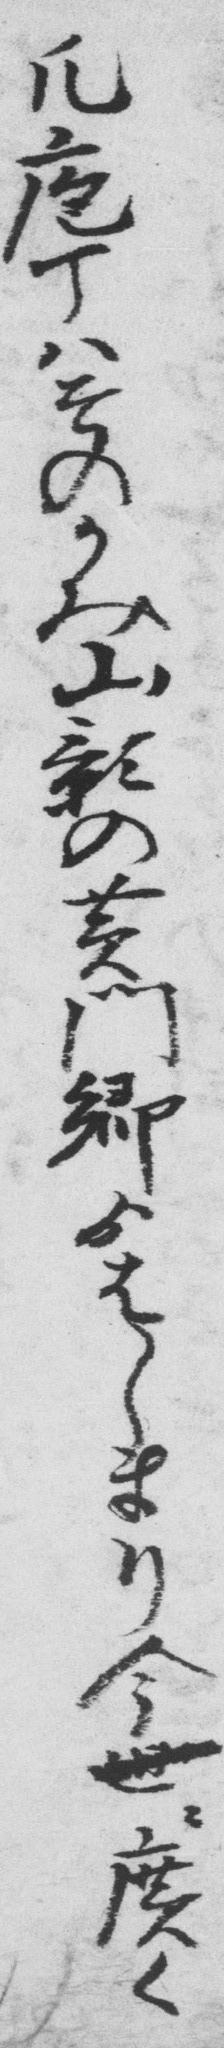凡庖丁はそのかみ山影の黄門郷ゟはしまり今世に広く
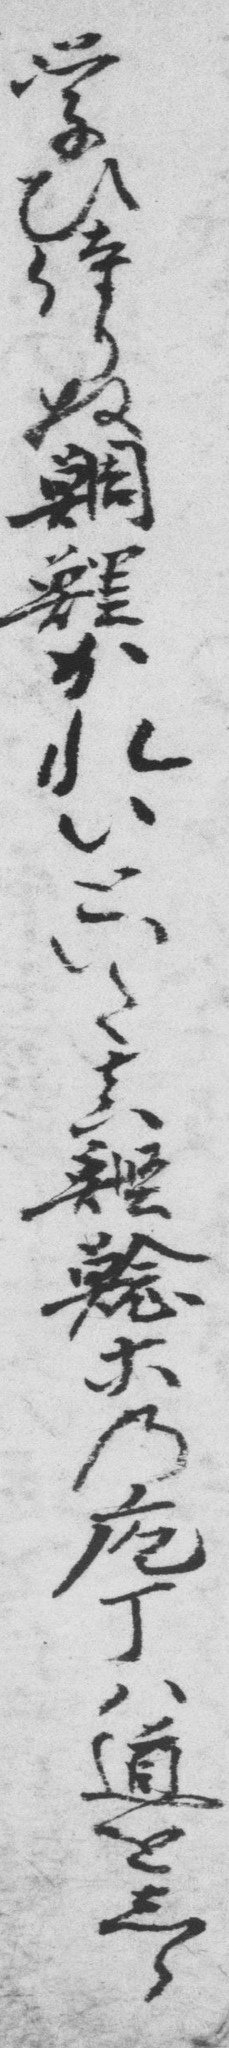学ひ侍りぬ鯛鯉かれいといた真鰹鯰等の庖丁は道をしら
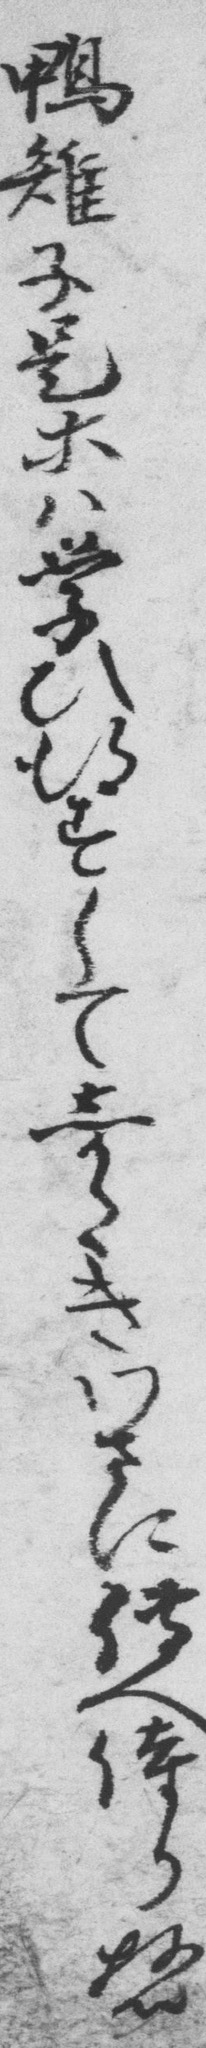鴨雉子是等は学ひ得すしてしかたきわさに伝へ侍りぬ
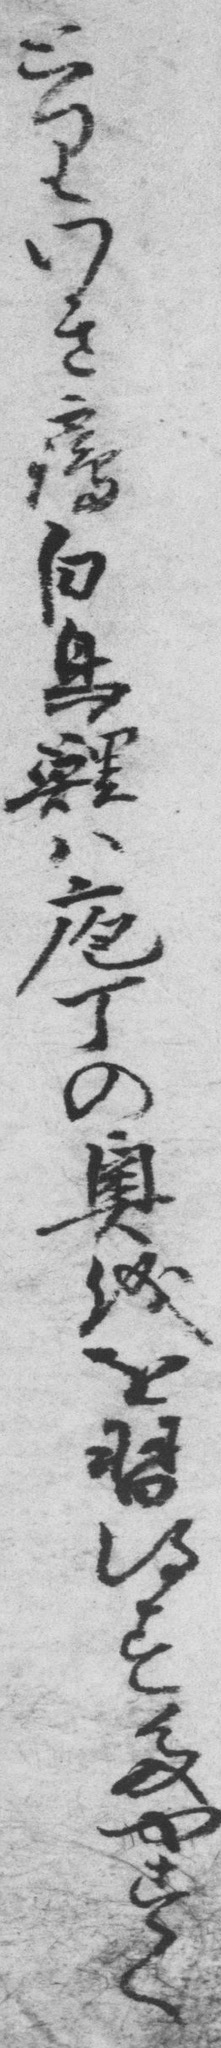とりわき鶴白鳥鯉は庖丁の奥儀を修得すたやすく

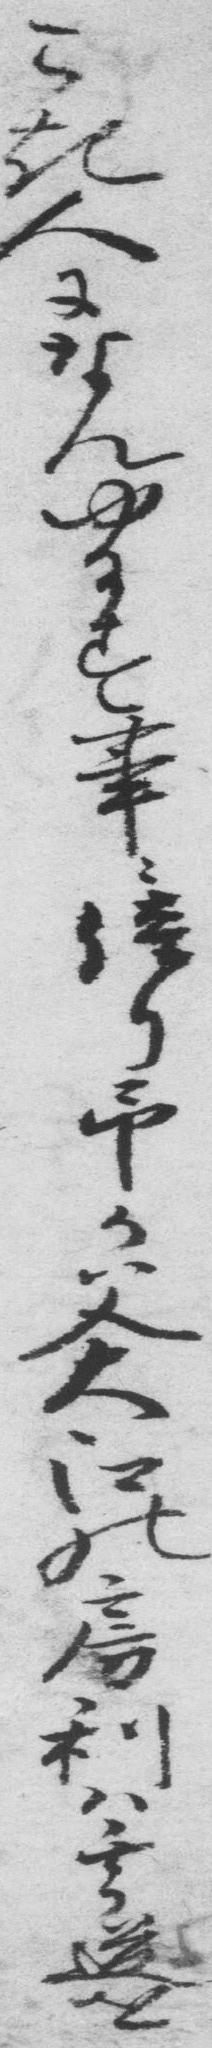こき人になんゆるす事に侍り予か父大江の房利は其道を
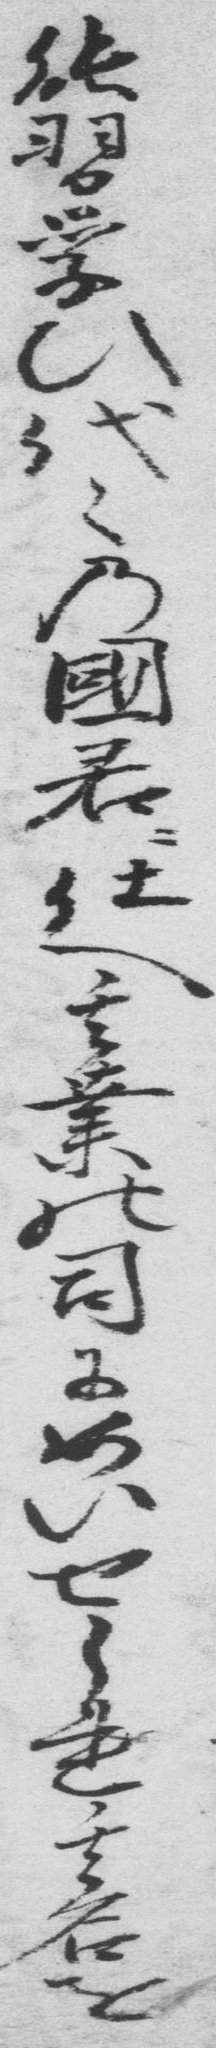能習学ひ代々の国君に仕へ其業の司にめいせられ其名を
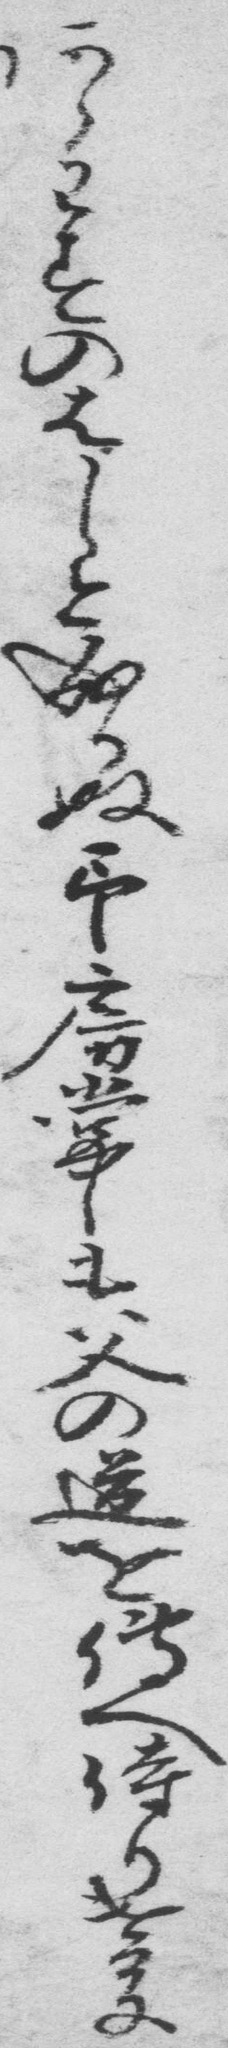あらわすのはしと成りぬ予房常も父の道を伝へ侍りけるに
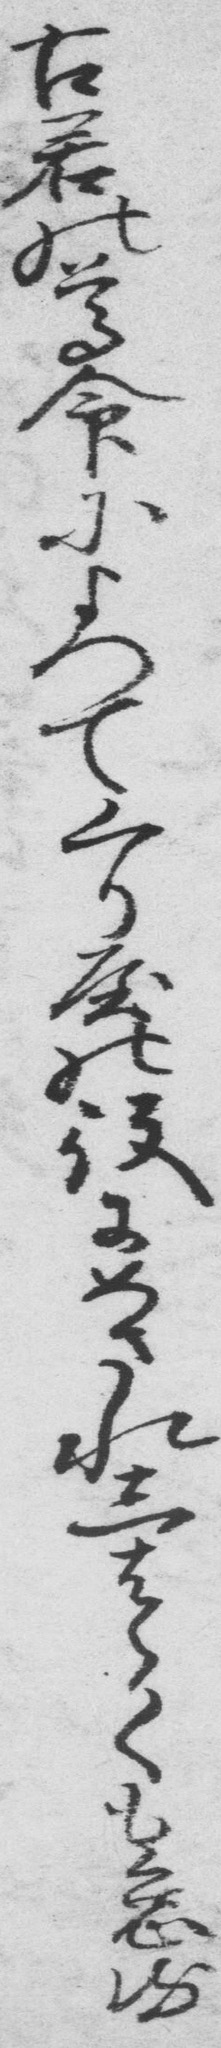古君の尊命によつてくりやの役にめされしはらくも怠る
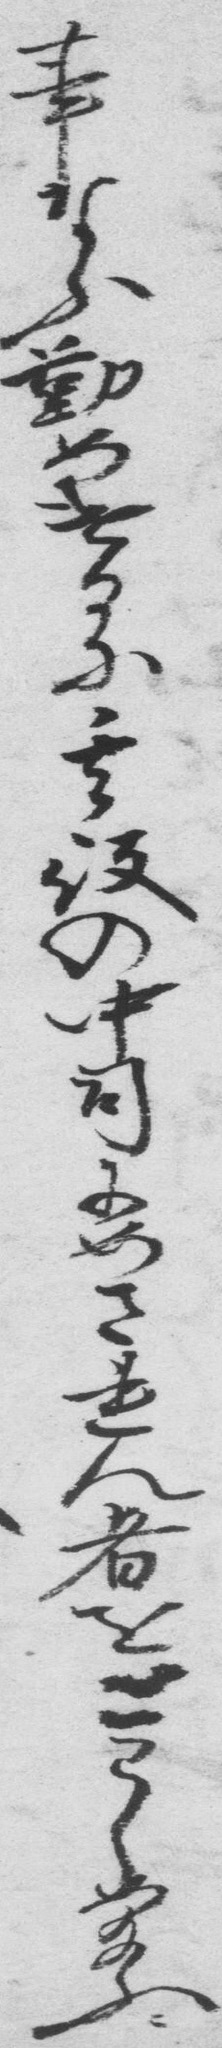事なふ勤めけるに其役の中司にめされん者をとわしめ給ふに
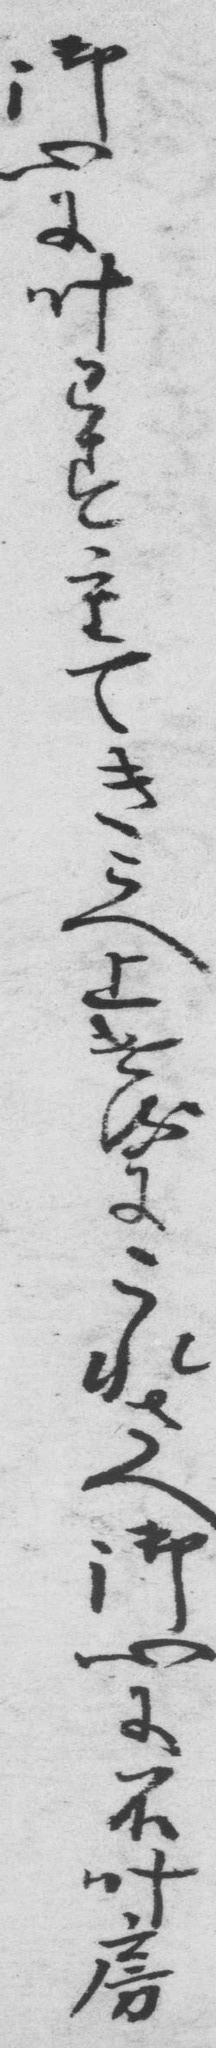御心に叶わす重てきこへ上けるにこれさへお心に不叶房
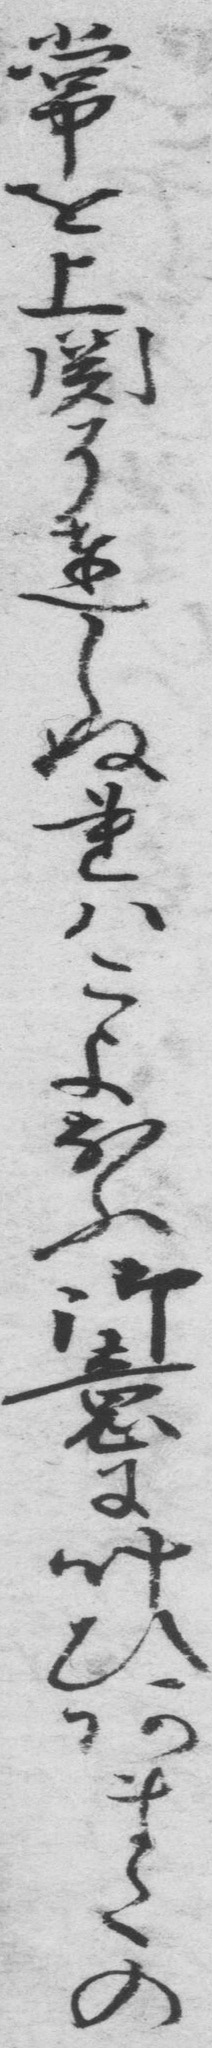常を上関に達しぬれはこよなふ御意に叶ひあまたの
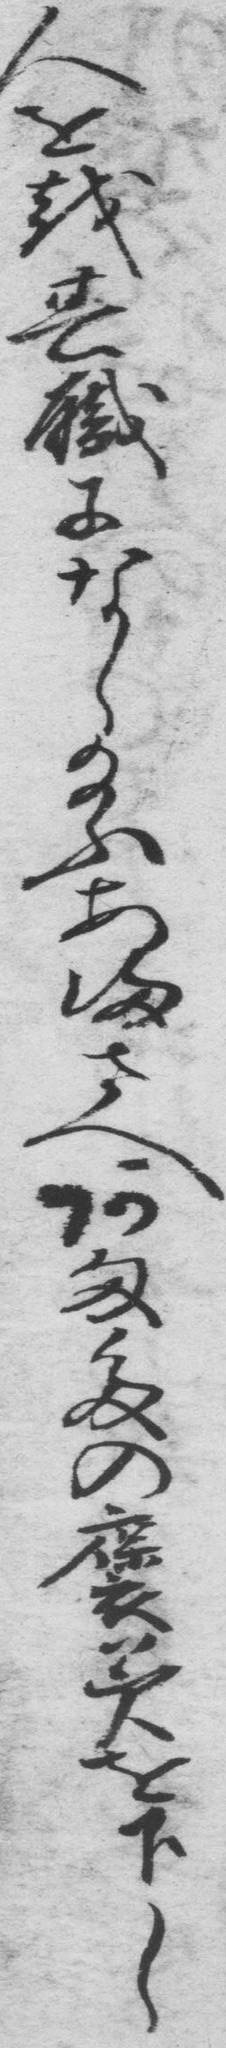人を越其職になし給ふあまさへあまたの褒美を下し
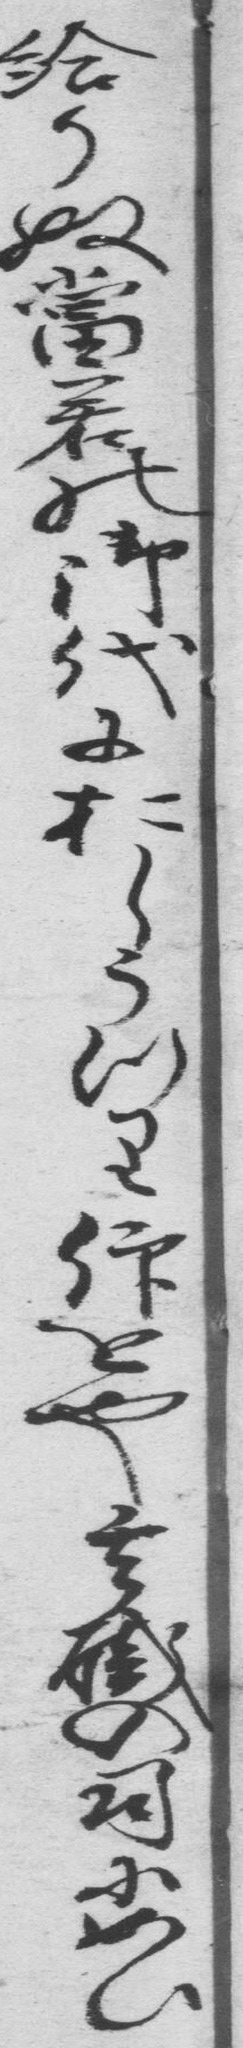給りぬ当君の御代におしうつり仰をや其職の司にめい
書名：料理集
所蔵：大阪府立大学学術情報センター 国文学研究資料館
